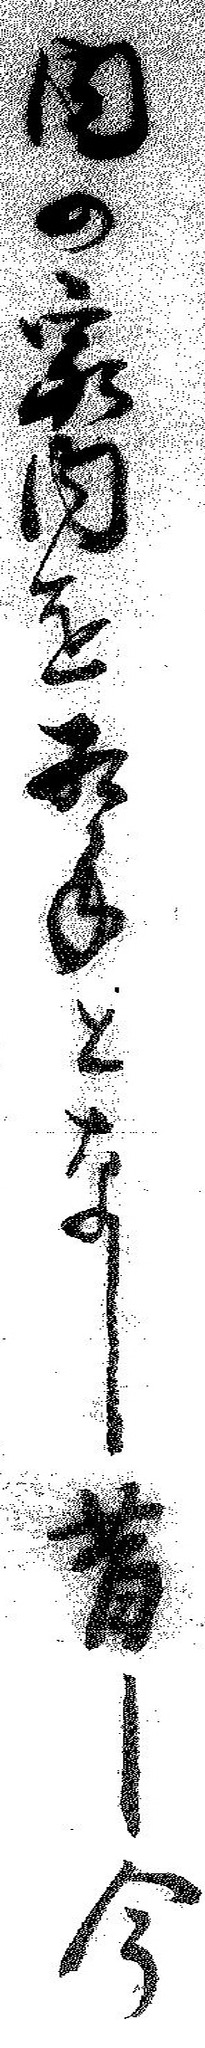内の家内を相手となし昔し今
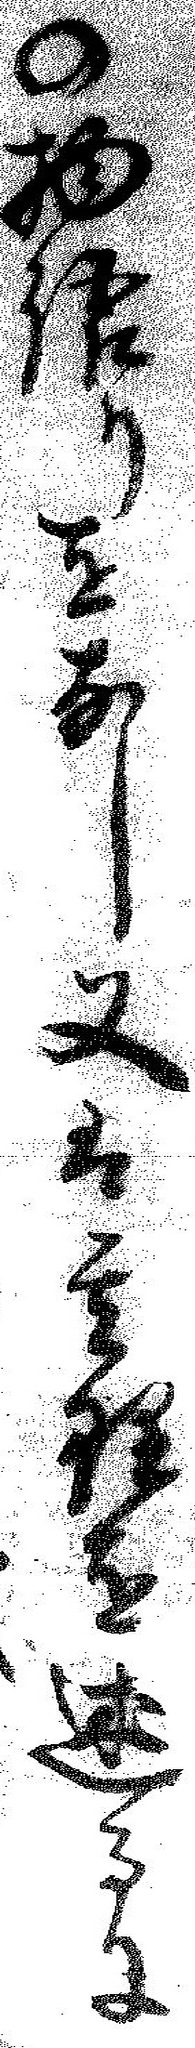の物語りをなし又は其理を述るに
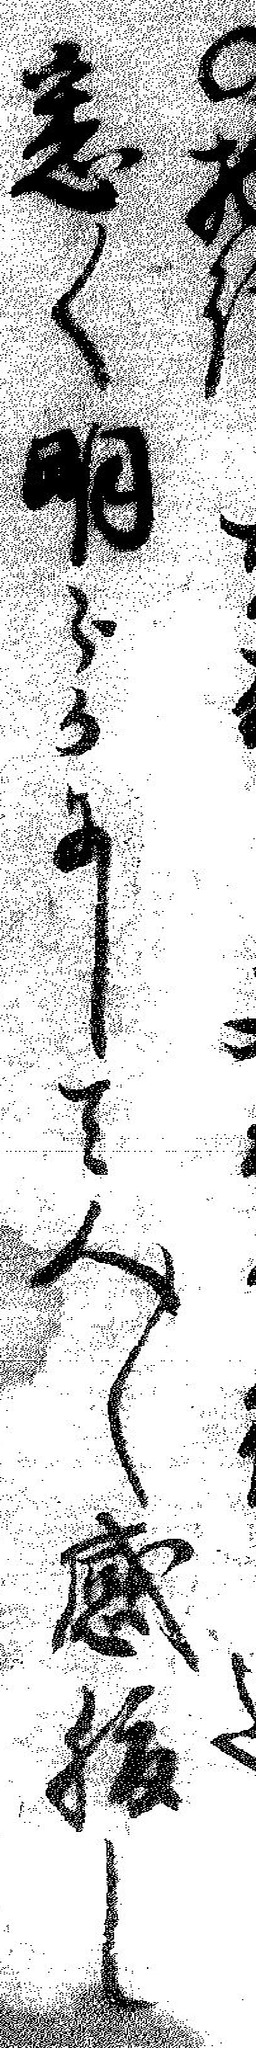悉く明らかにして人〳〵感服し
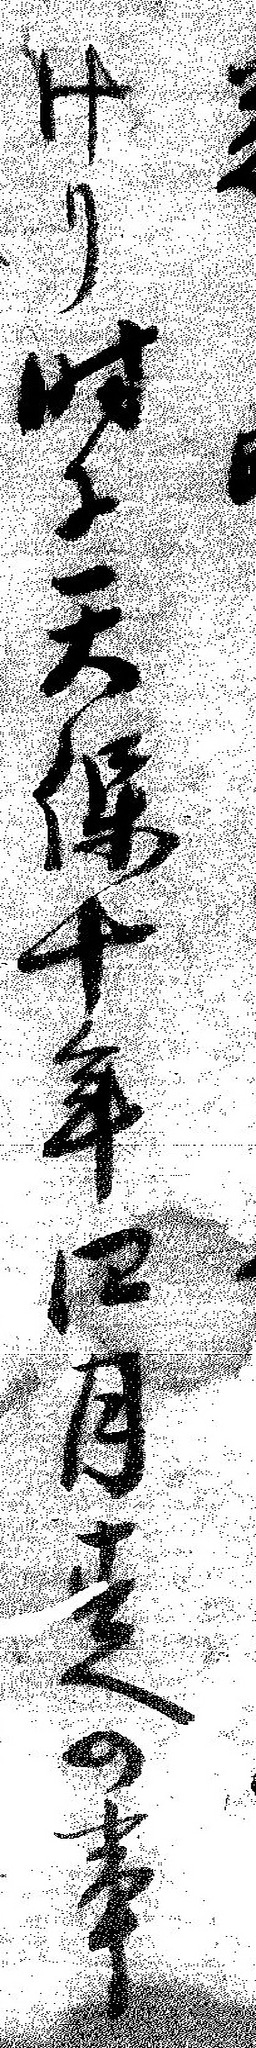けり時に天保十年四月すへの事
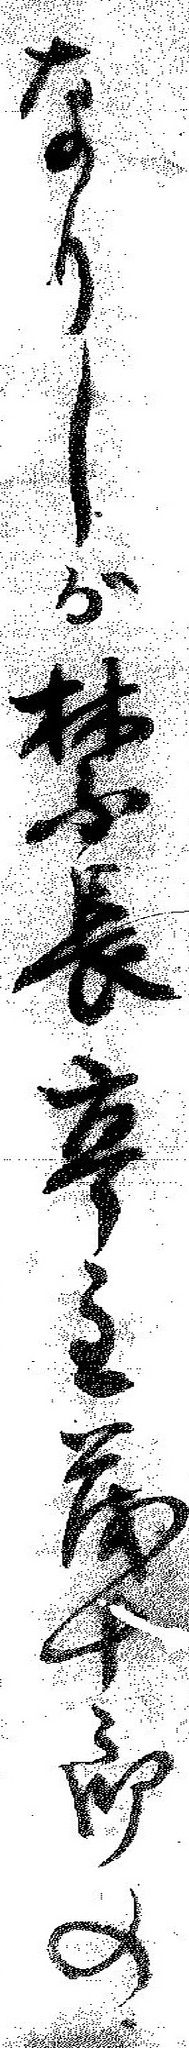なりしが禁長亭主茂十郎の
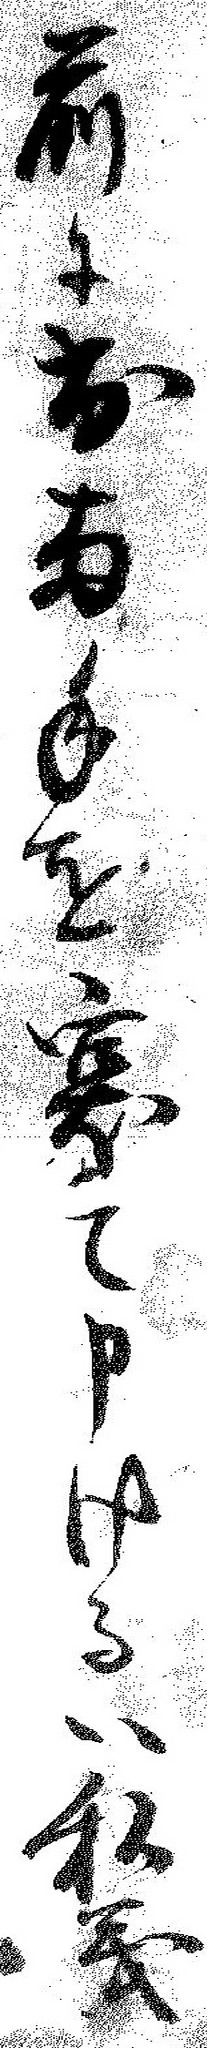前に出両手を突いて申けるは私義
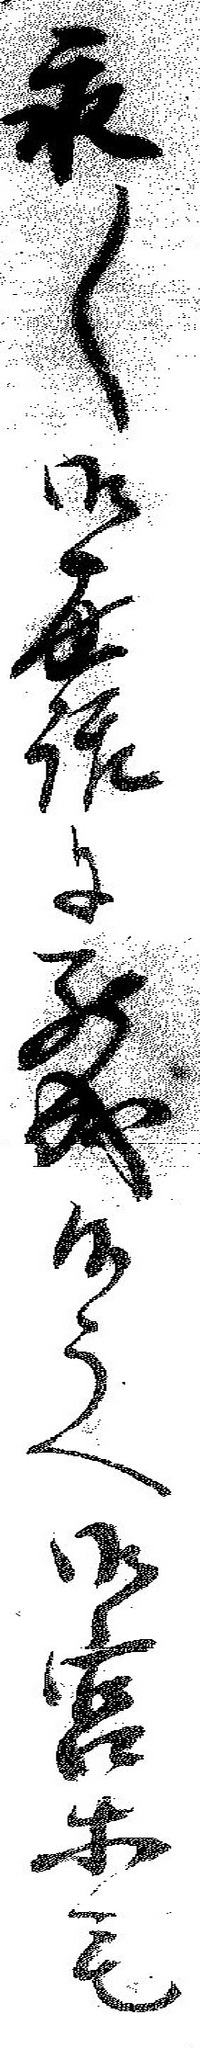永〳〵御世話に罷成候うへ御宮等も
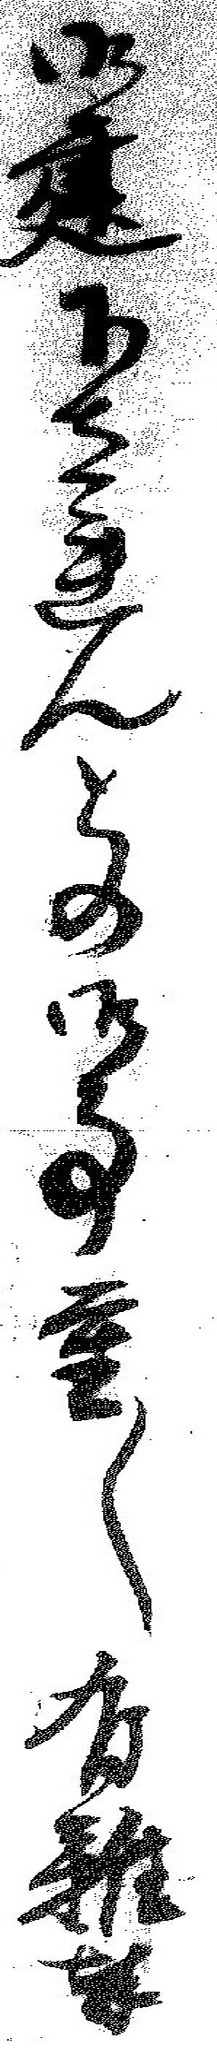御建下されんとの御事重〳〵有難奉
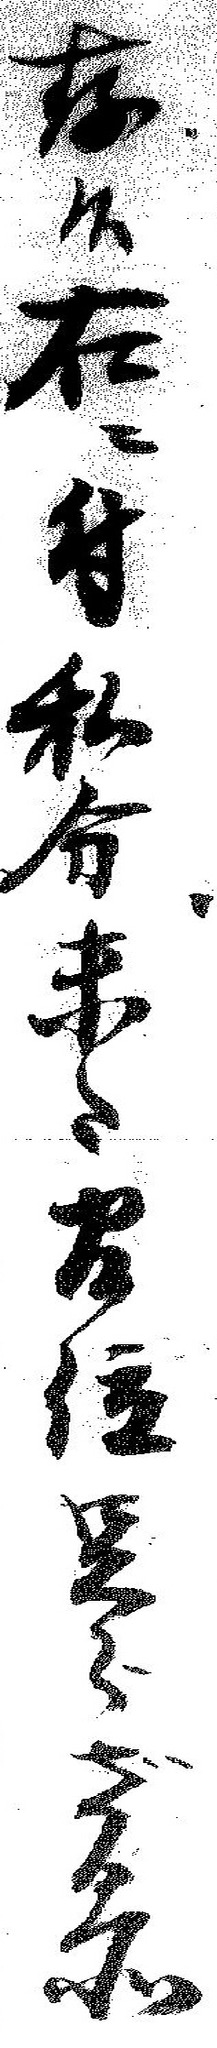存候右に付私分未た官位足らざる所
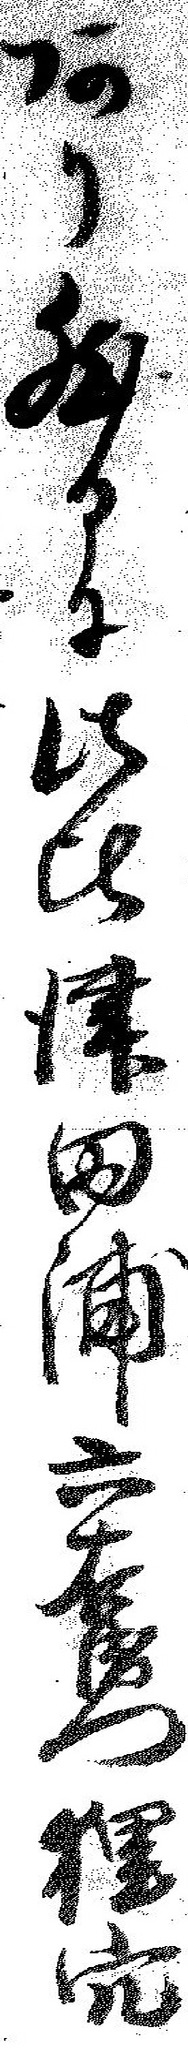あり然るに此頃津田浦六右衛門狸穴
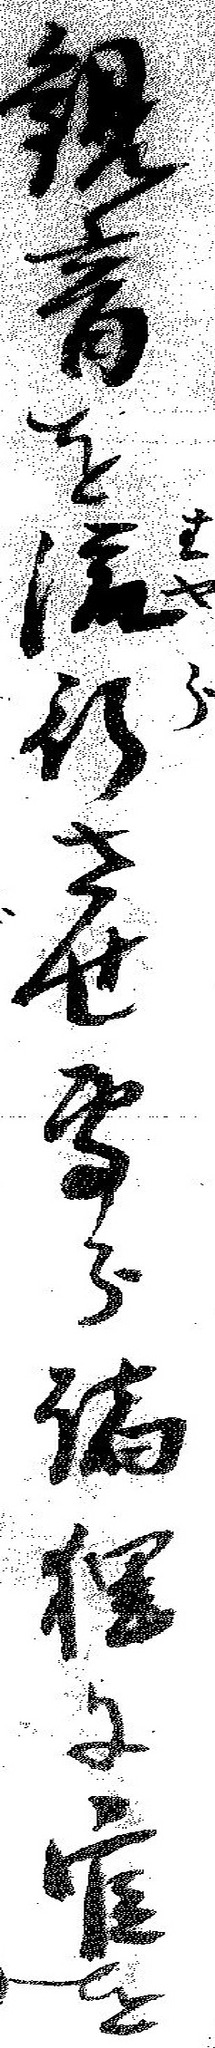観音を流行させ専ら諸狸に官を
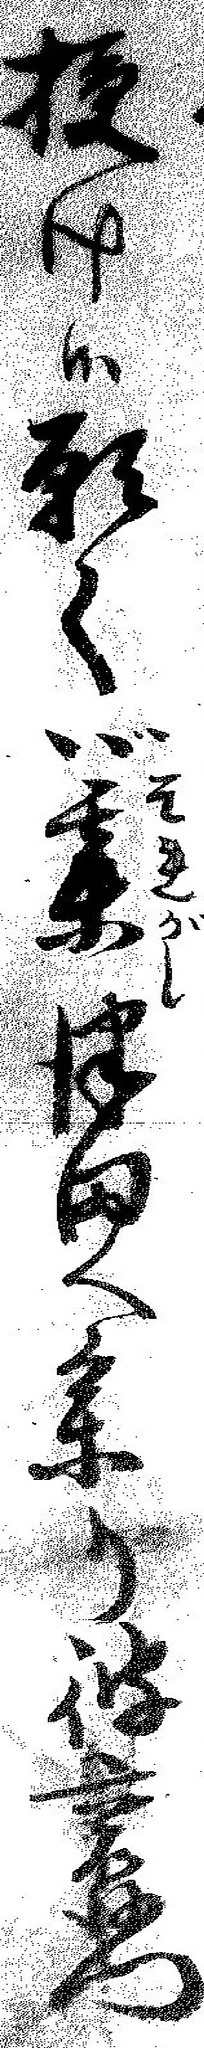授け候願くば某津田へ参り彼六右衛門
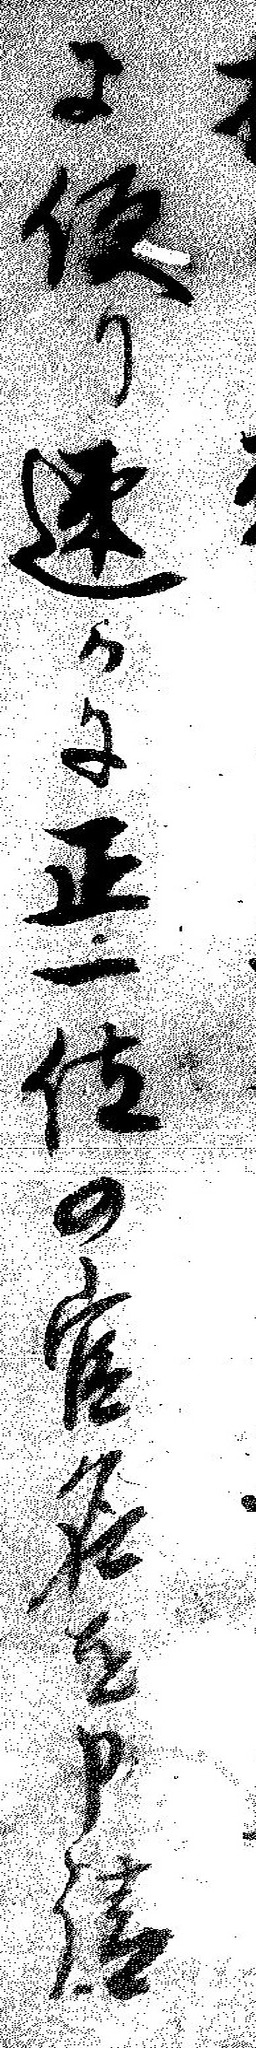に便り速かに正一位の官名を申請

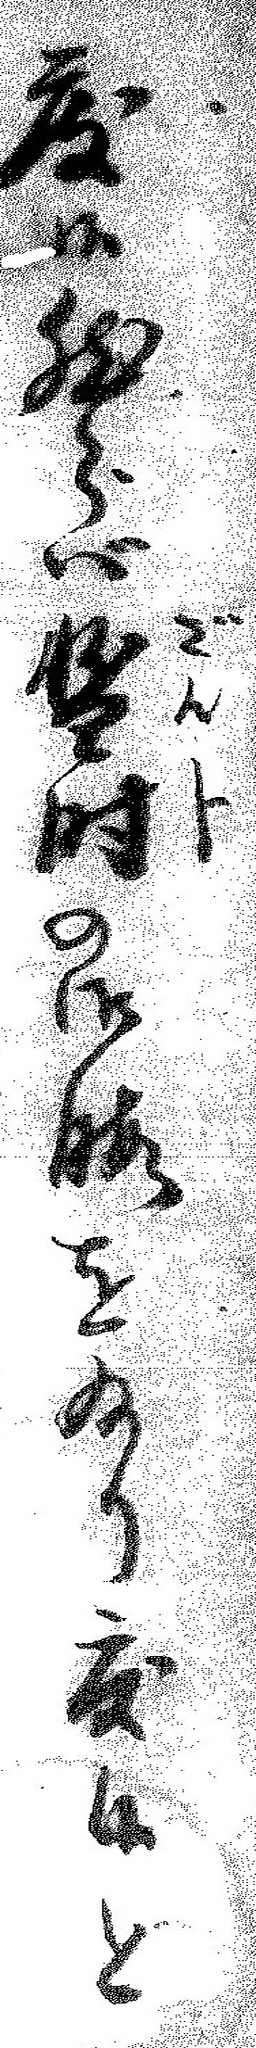度候然らば暫時の御暇を給り度候と
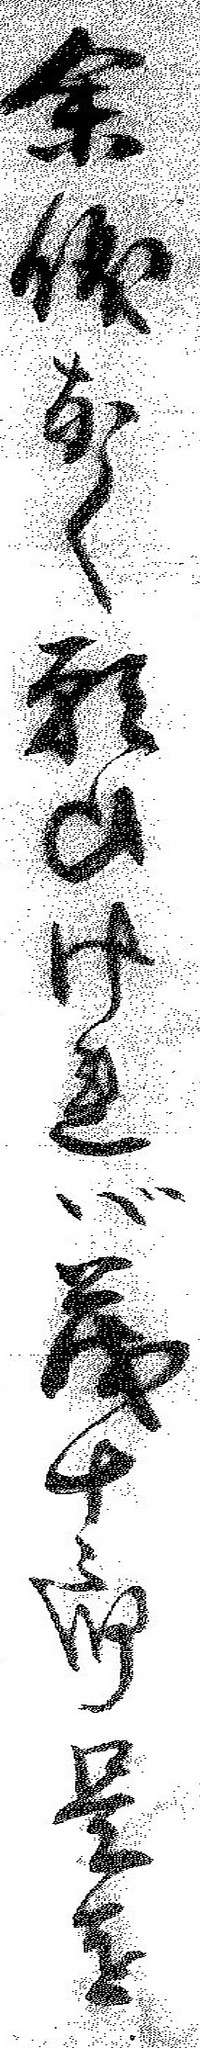余儀なく願ひければ茂十郎是を
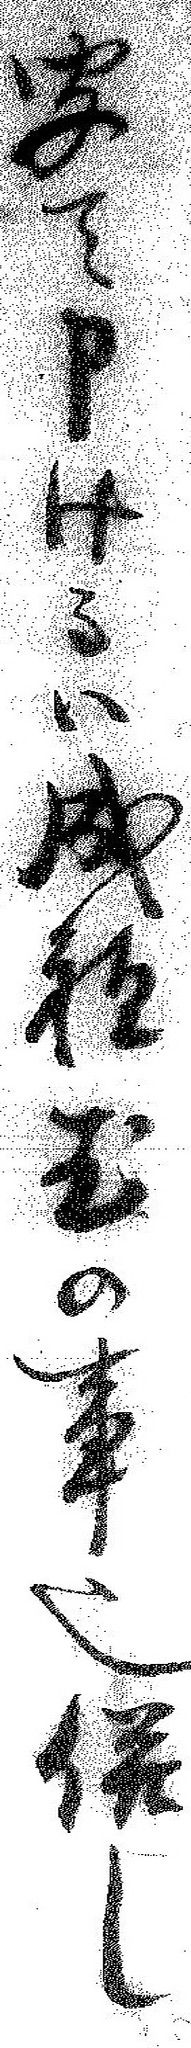聞て申けるは成程尤の事也併し
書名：近頃古狸珍説　礼義智信
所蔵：徳島県立図書館
